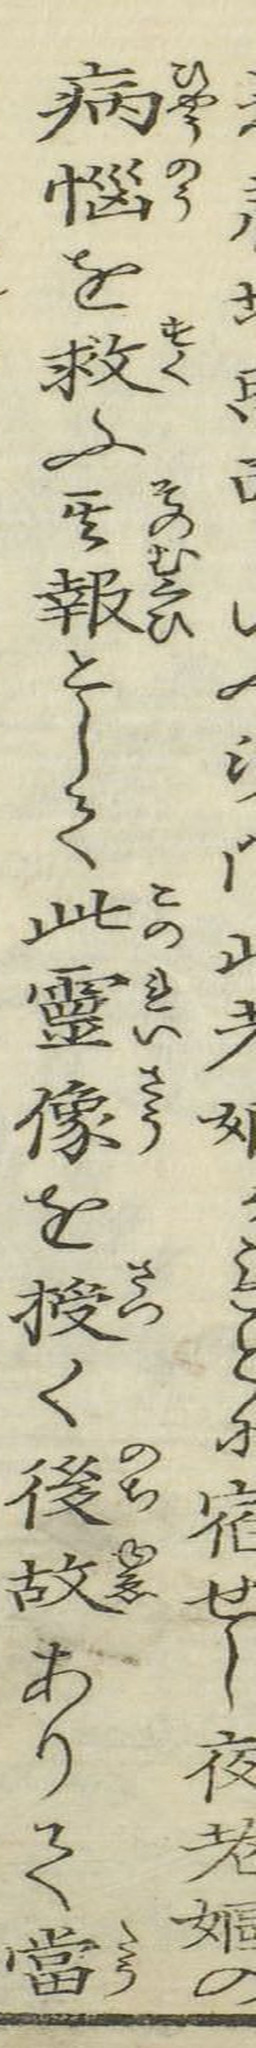病悩を救ふ其報として此霊像を授く後故ありて當
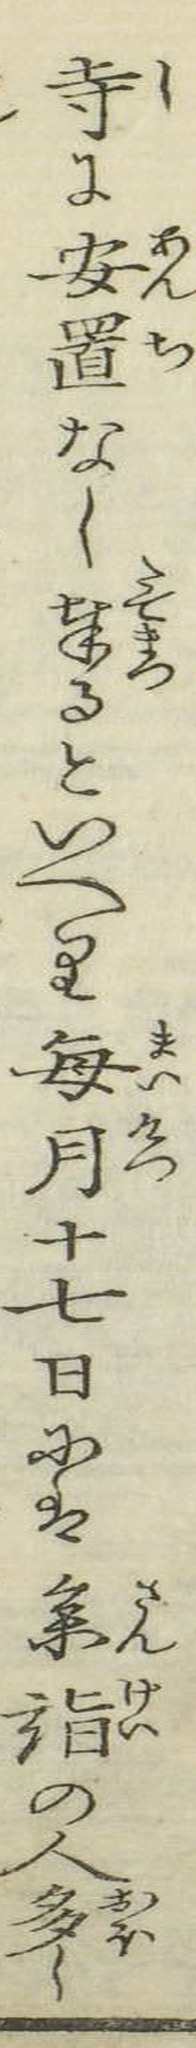寺に安置なし奉るといへり毎月十七日には参詣の人多し
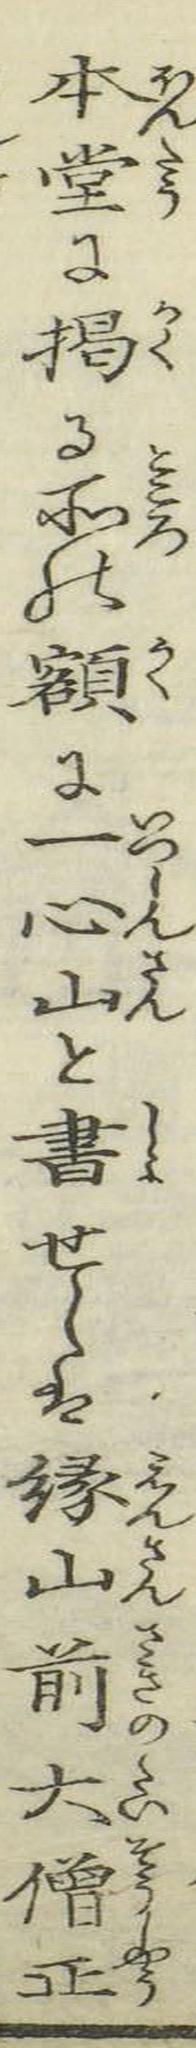本堂に掲る所の額に一心山と書せしは縁山前大僧正
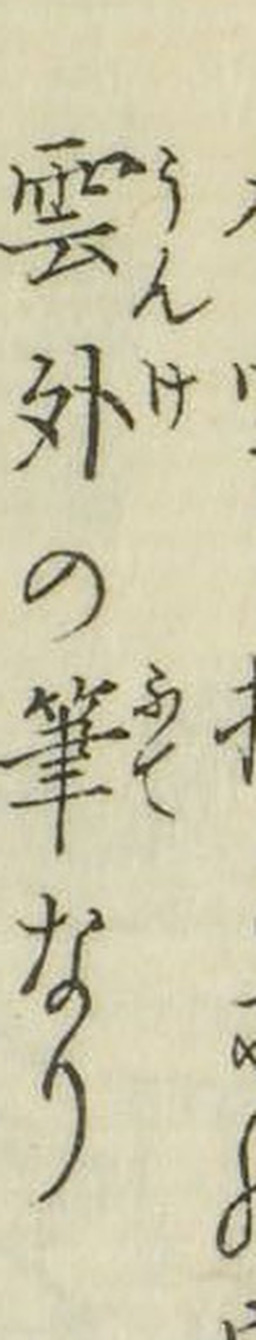雲外の筆なり
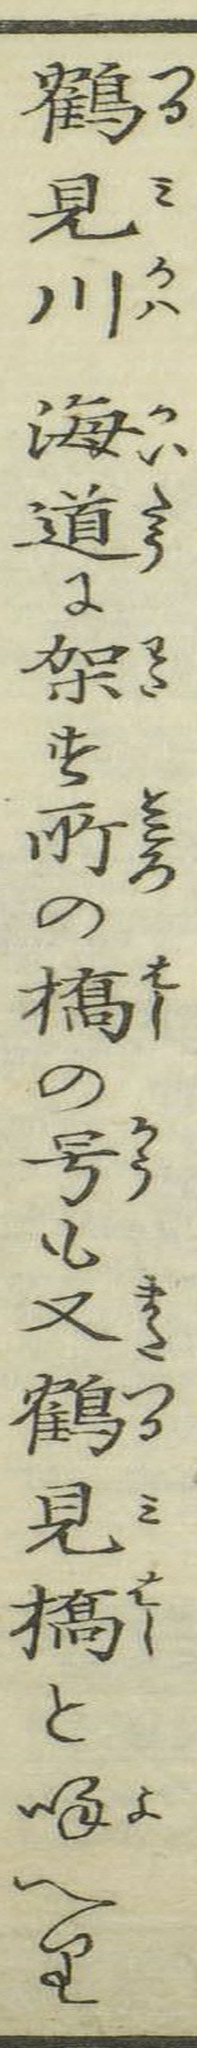鶴見川海道に架す所の橋の号も又鶴見橋と呼へり

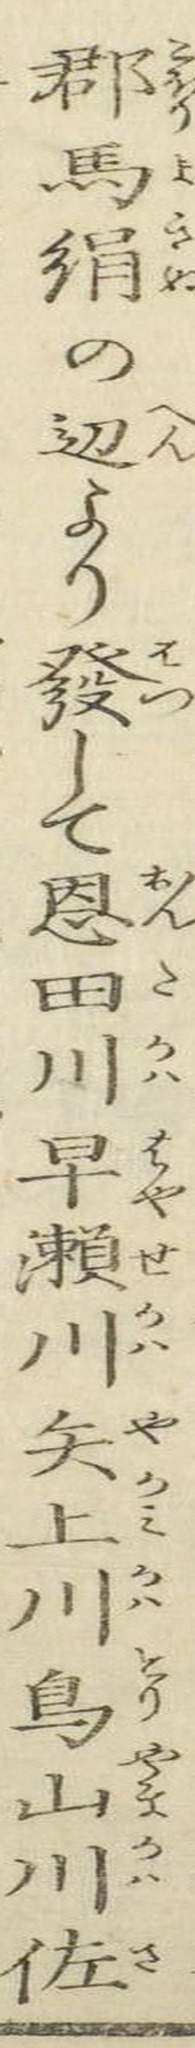郡馬絹の辺より發して恩田川早瀬川矢上川鳥山川佐
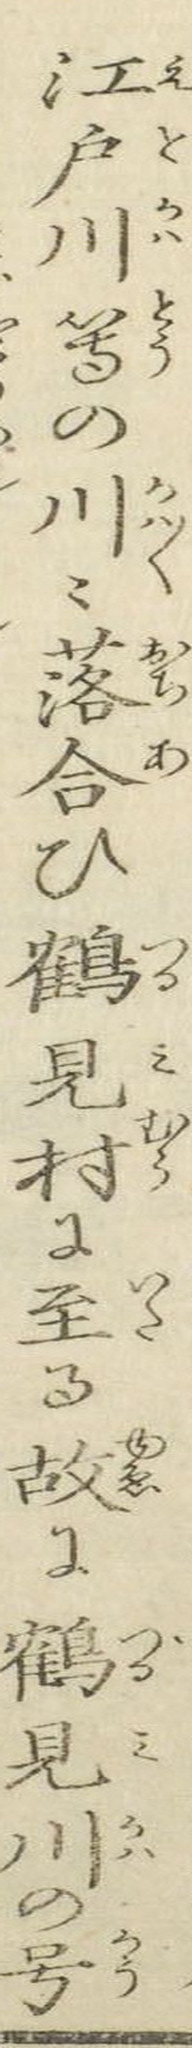江戸川等の川々落合ひ鶴見村に至る故に鶴見川の号
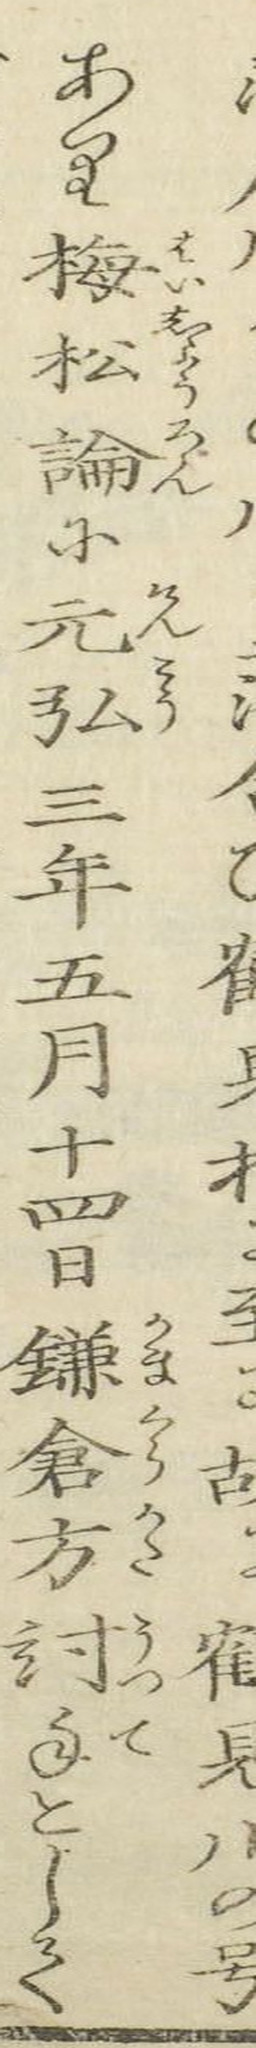あり梅松論に元弘三年五月十四日鎌倉方討手として
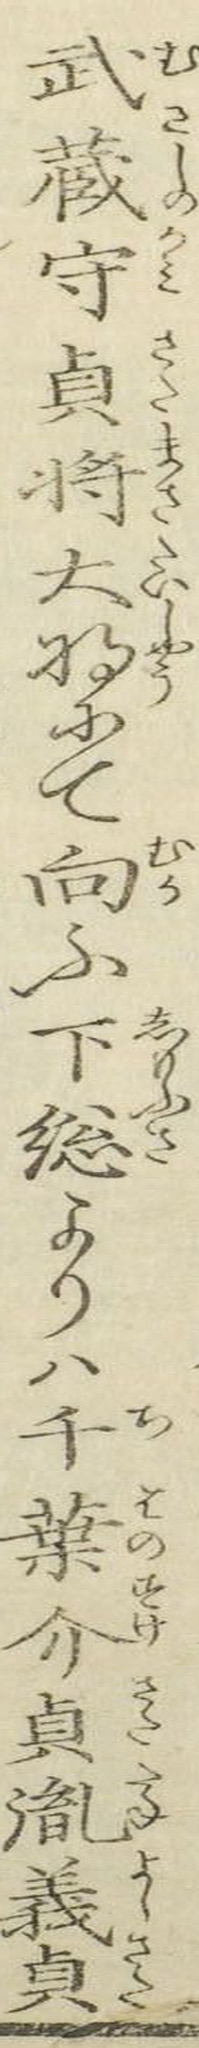武蔵守貞将大将にて向ふ下総よりは千葉介定貞胤義貞
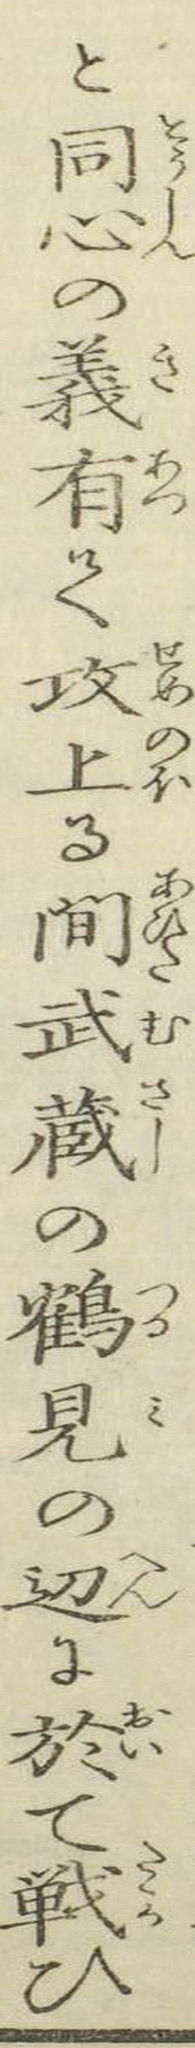と同心の義有て攻上る間武蔵の鶴見の辺に於て戦ひ
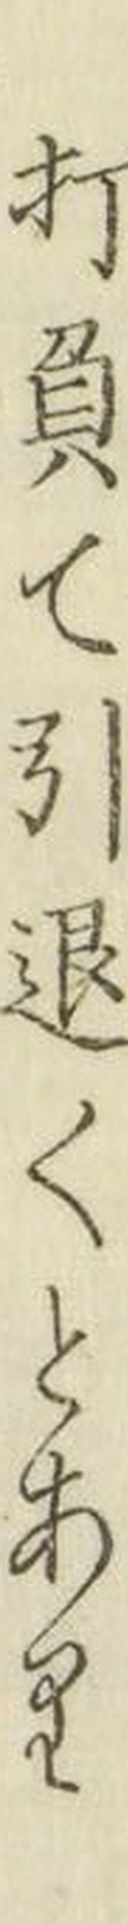打負て引退くとあり
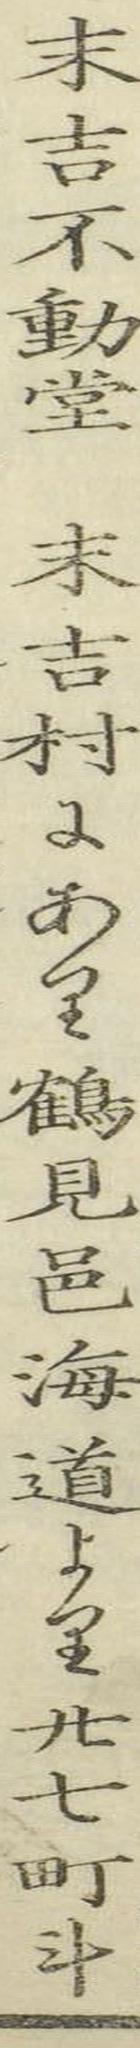末吉不動堂末吉村にあり鶴見邑海道より廿七町斗
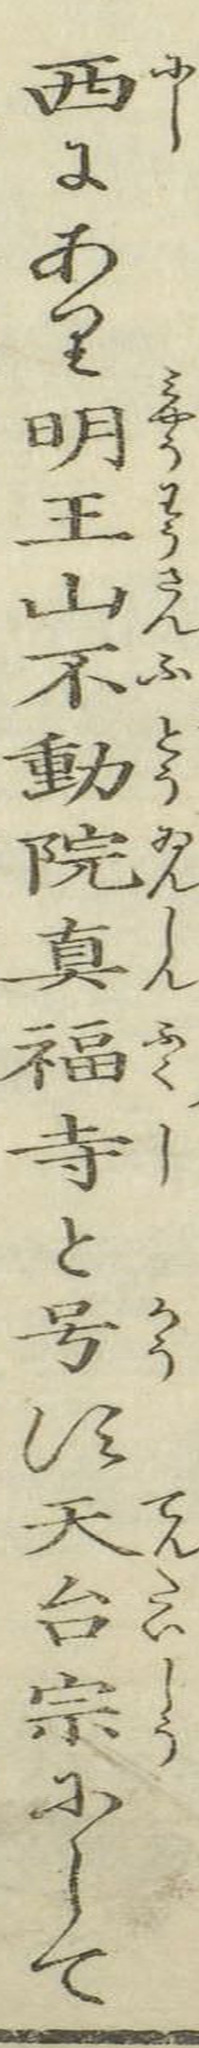西にあり明王山不動院真福寺と号す天台宗にして
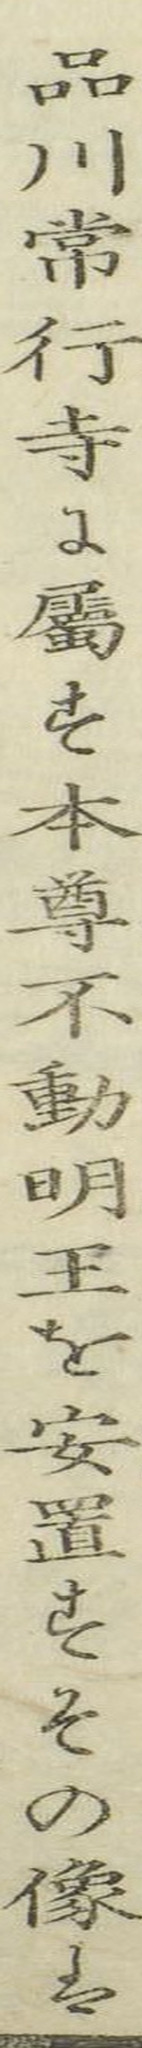品川常行寺に属す本尊不動明王を安置すその像は
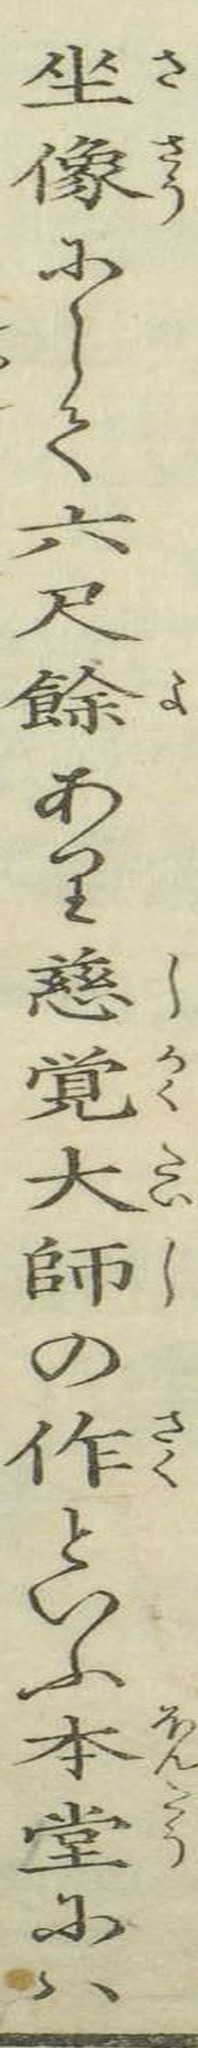坐像にして六尺餘あり慈覚大師の作といふ本堂には
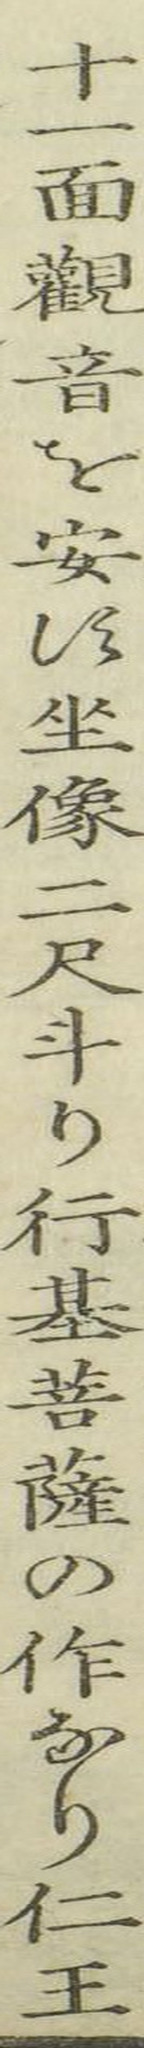十一面観音を安す坐像二尺斗り行基菩薩の作なり仁王
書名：江戸名所図会 20巻 巻之5
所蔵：東京学芸大学教育コンテンツアーカイブ
